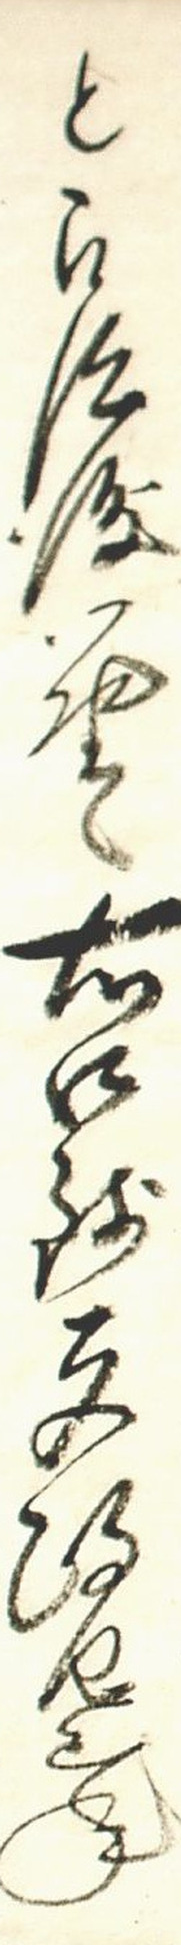と被仰渡御座候右口銭文政四巳年
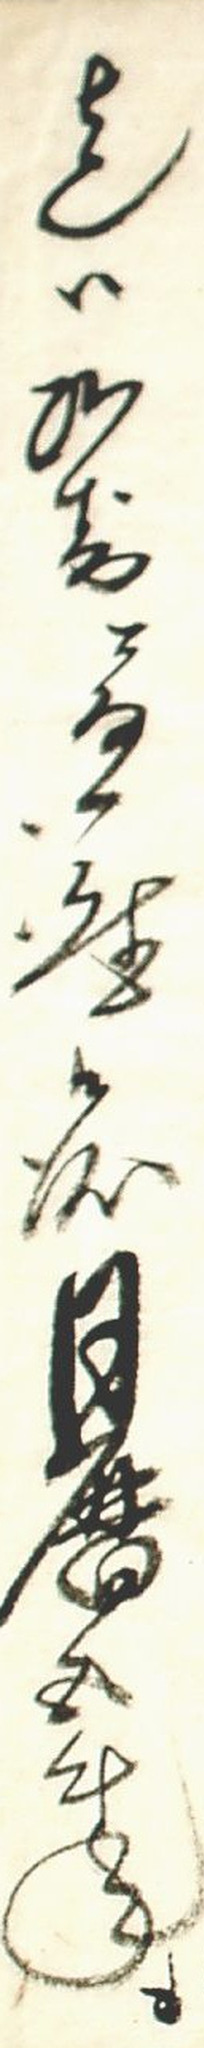迄は弐歩にて御座候所同暦五午年に
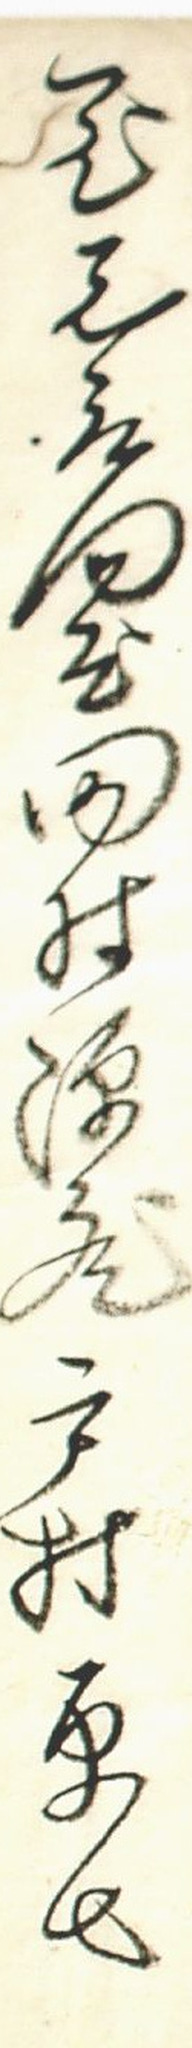至元取問屋田村源蔵戸村平七
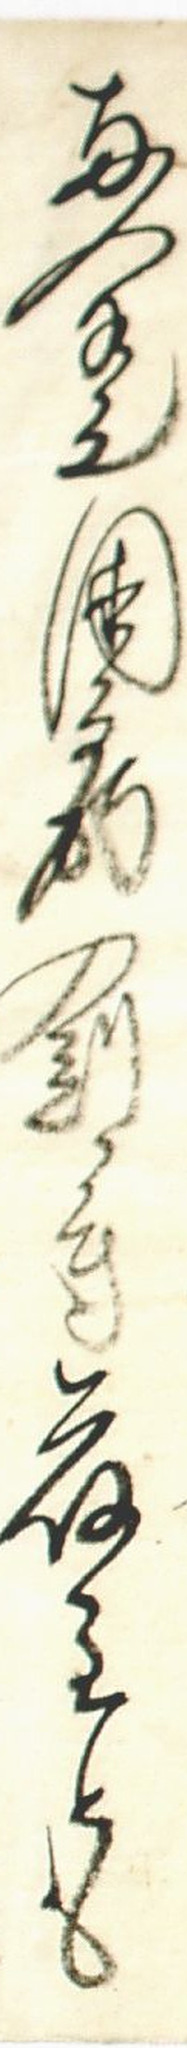両人手元困窮入刻に付荷主とも
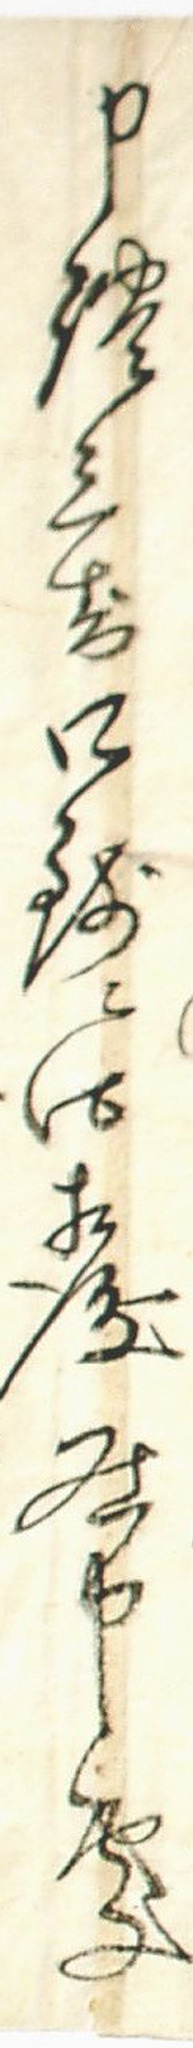申談三歩口銭に仕相渡居申処
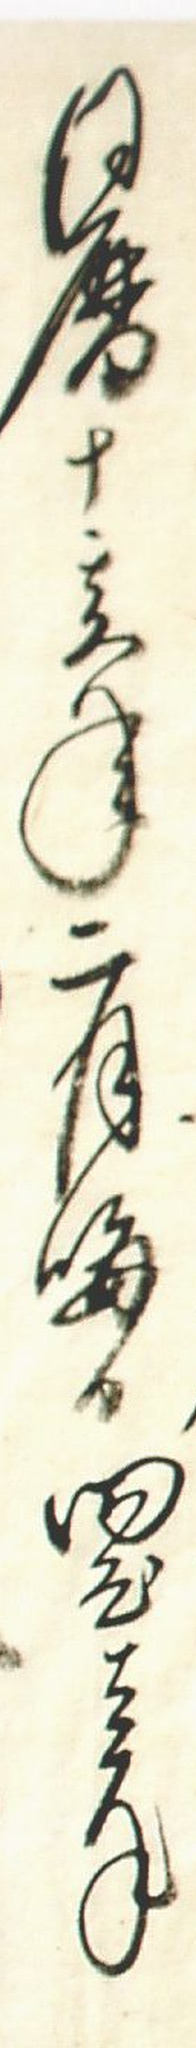同暦十亥年二月晦日問屋壱手
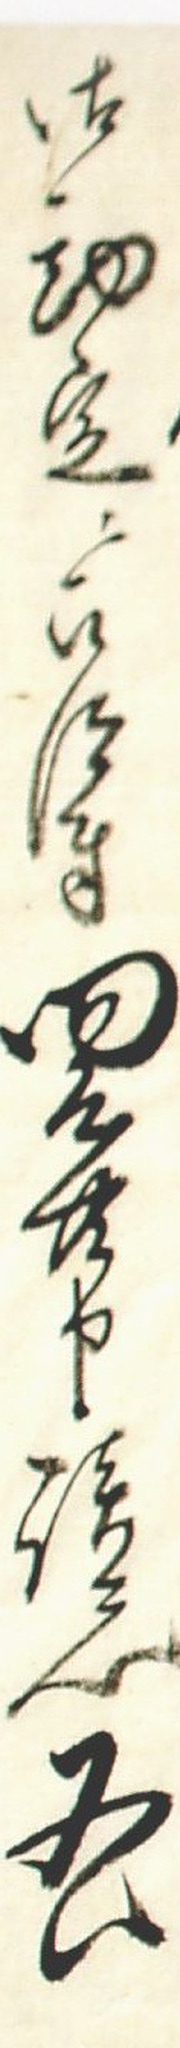御勘定に被仰付問屋共申談を以右
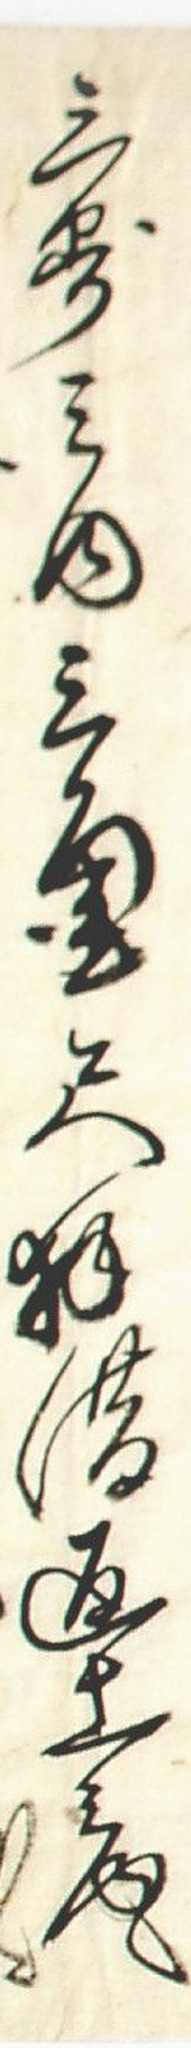三歩之内三厘尺拝借返上之内へ
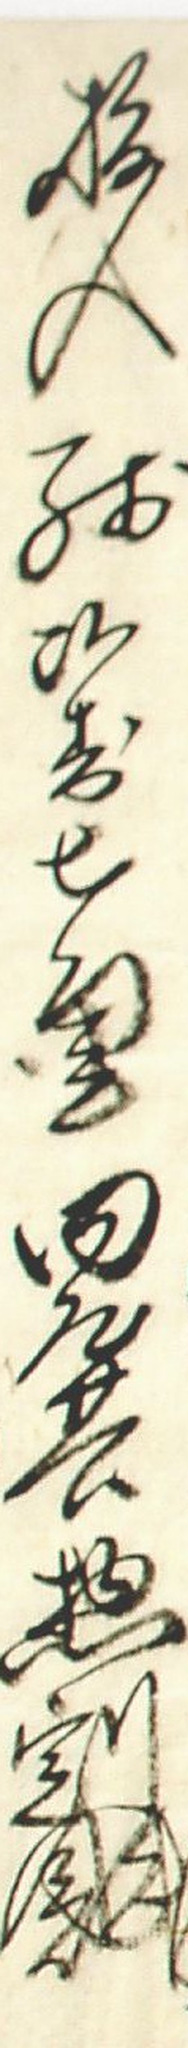指入残弐歩七厘問屋共惣割賦に
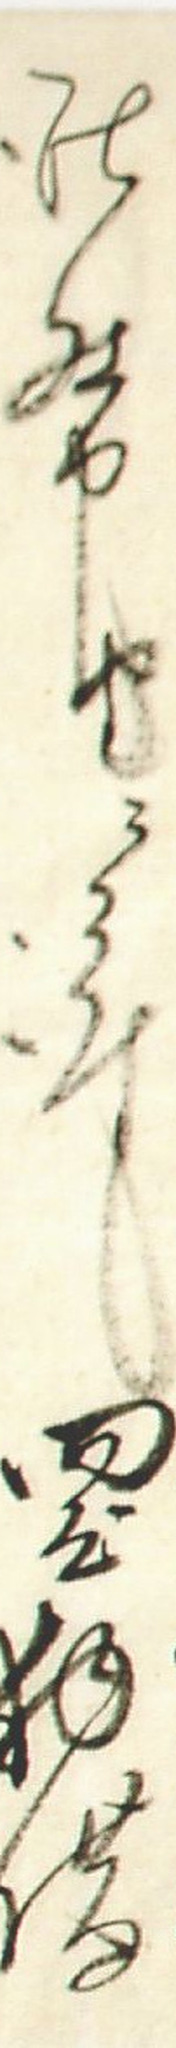仕居申由に御座候問屋拝借

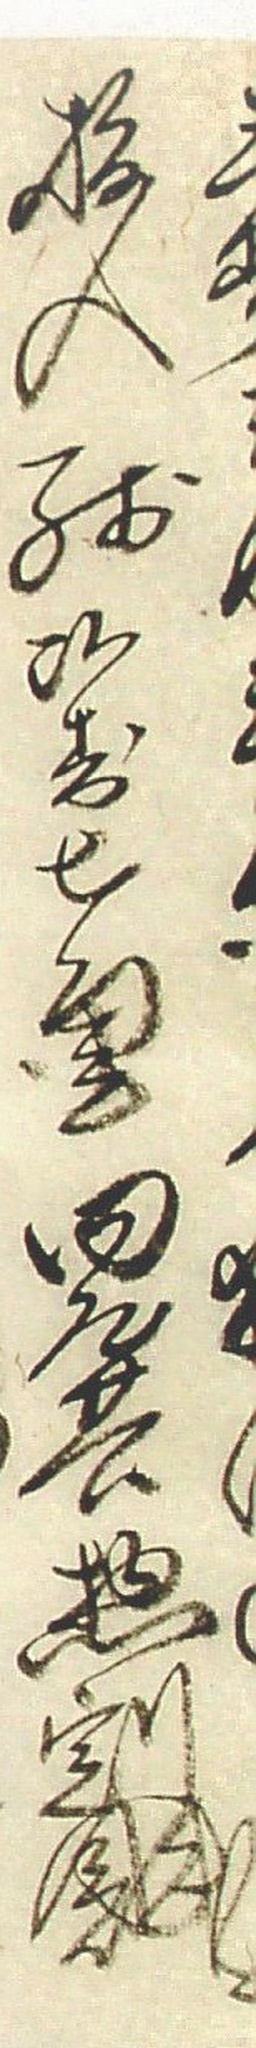指入残弐歩七厘問屋共惣割賦に
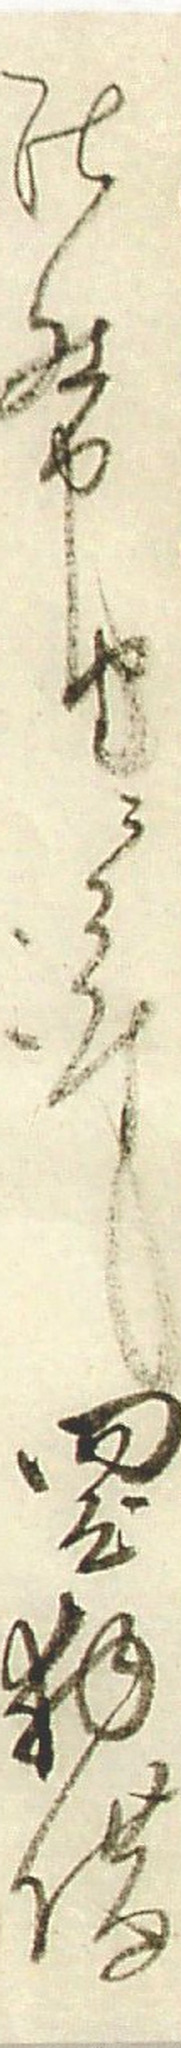仕居申由に御座候問屋拝借
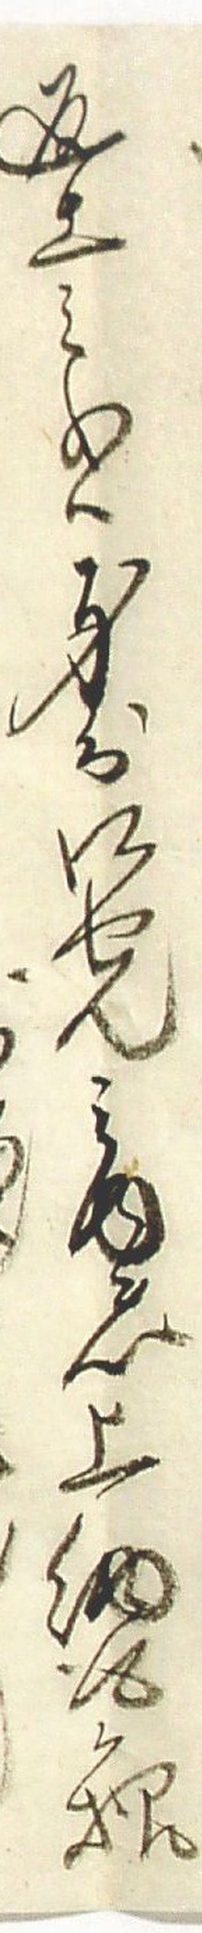返上之義は身分口せん之内を以上納仕候様
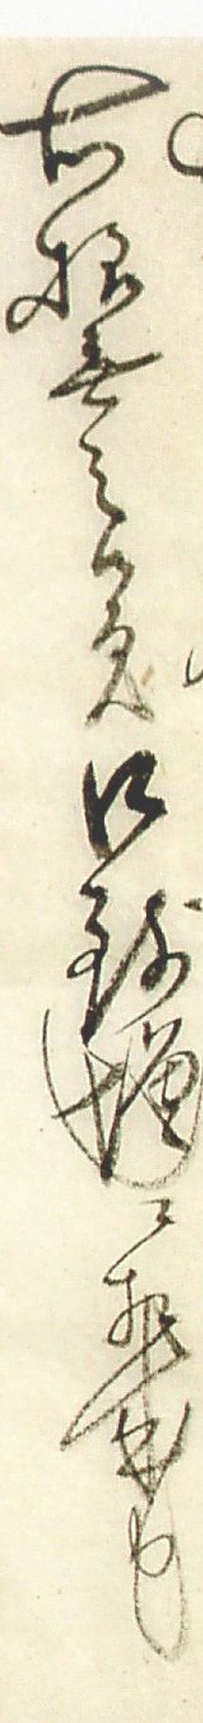右様無之候ては口銭増に相成申候
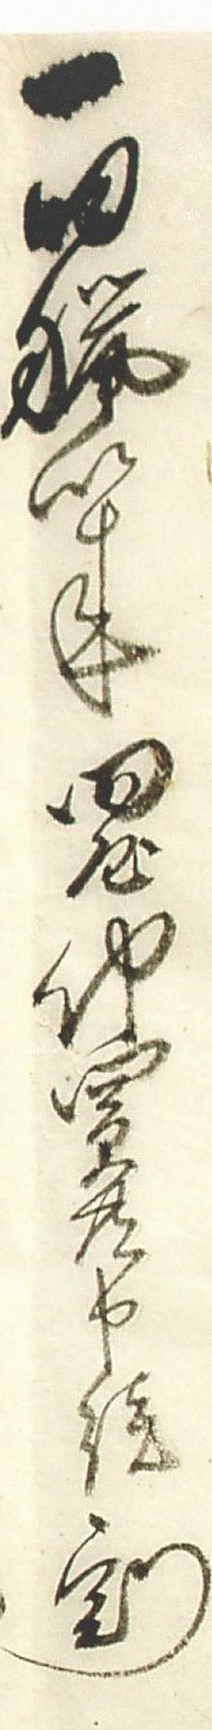一旧臘以来問屋仲買共申談刻
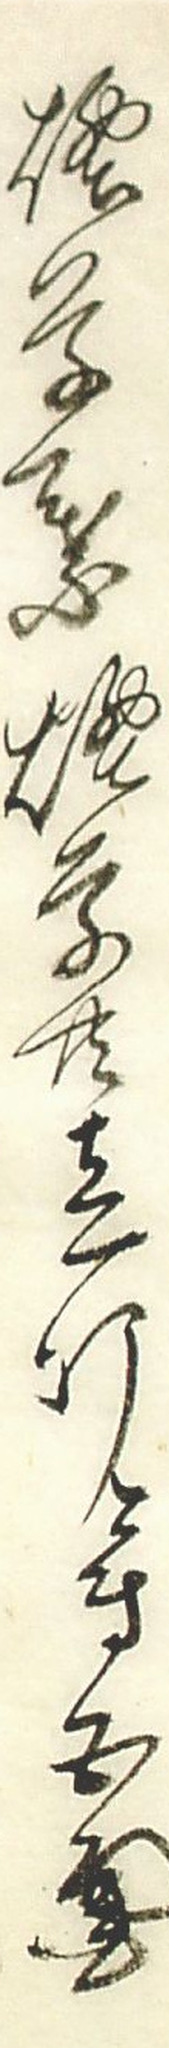煙草葉煙草共壱斤に付五厘
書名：煙草問屋扱方一件他
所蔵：鳴門教育大学 Naruto University of Education
